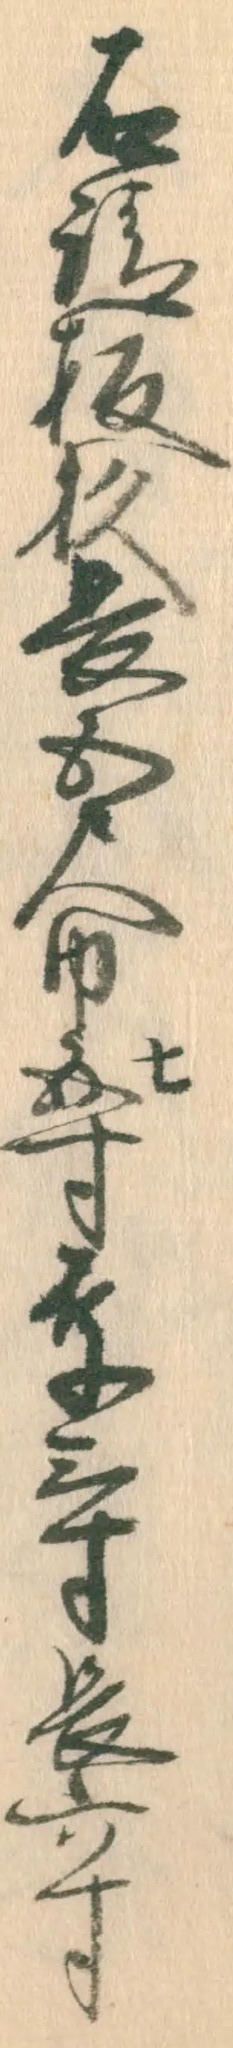右請板杉長五尺巾七寸厚三寸長六寸
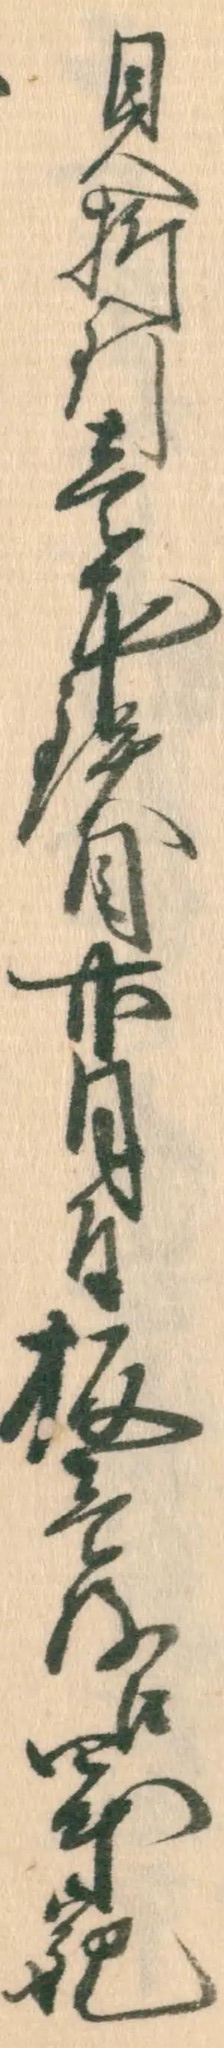貝折釘壱本鉄目廿目付板壱枚え四本宛
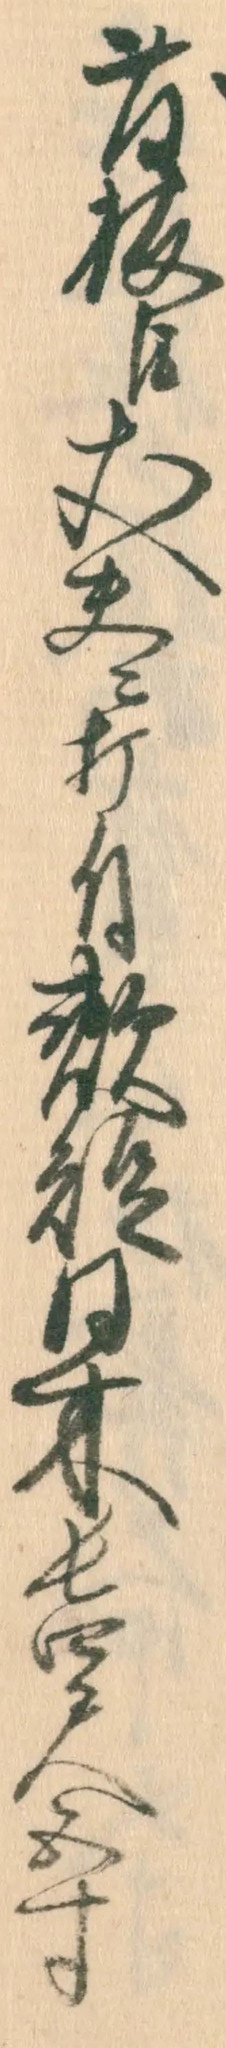敷板え丈夫ニ打付頬短同木長七尺五寸
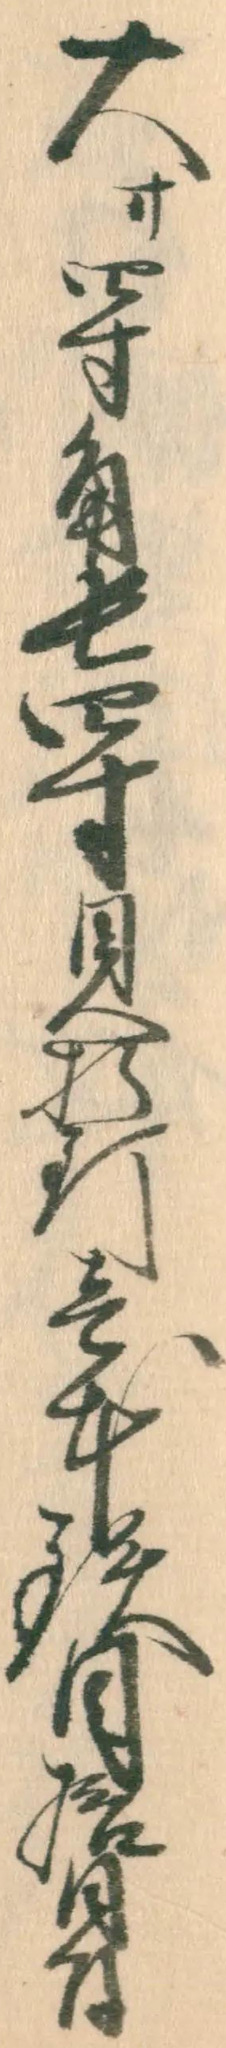大サ四寸角長四寸貝打釘壱本鉄目拾目付
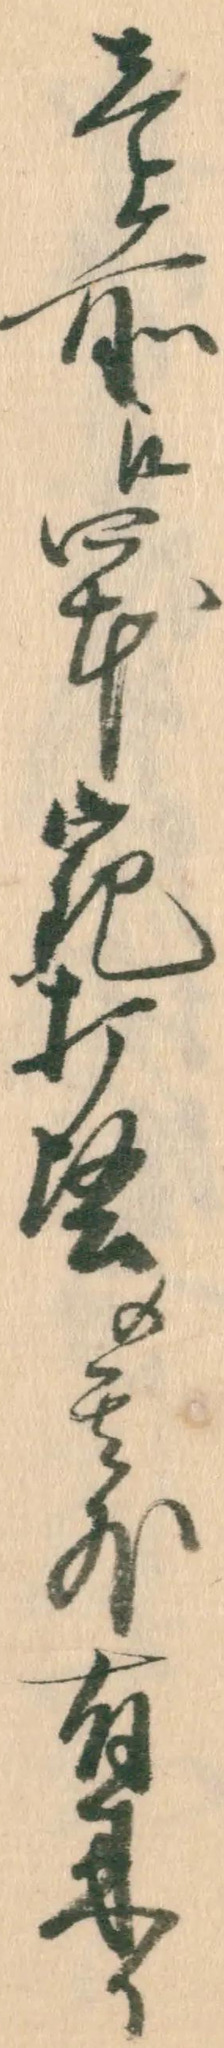壱ケ所え四本宛打堅メ其外有来り
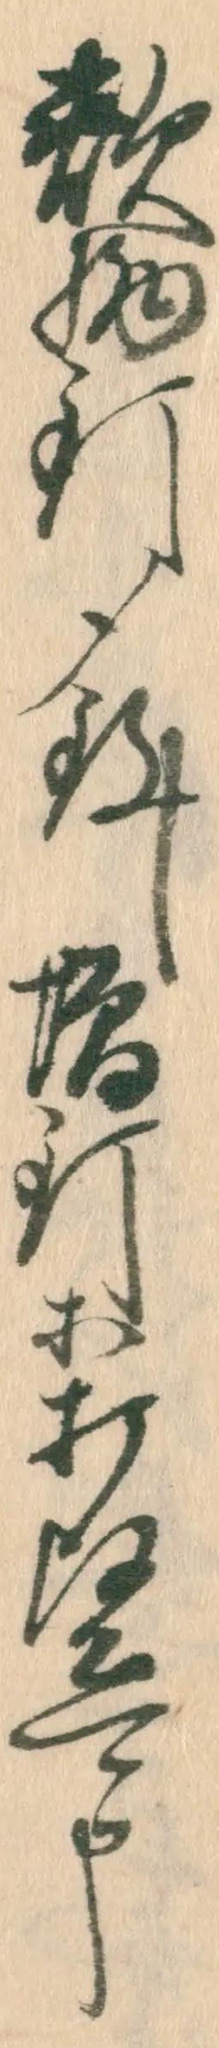頬柄釘〆致し増釘等打堅可申
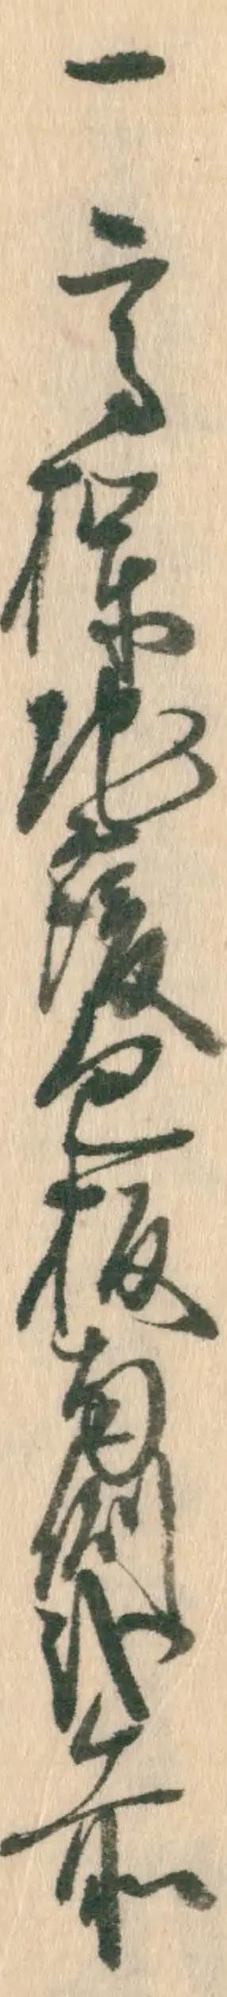一高欄地覆包板南側弐ケ所
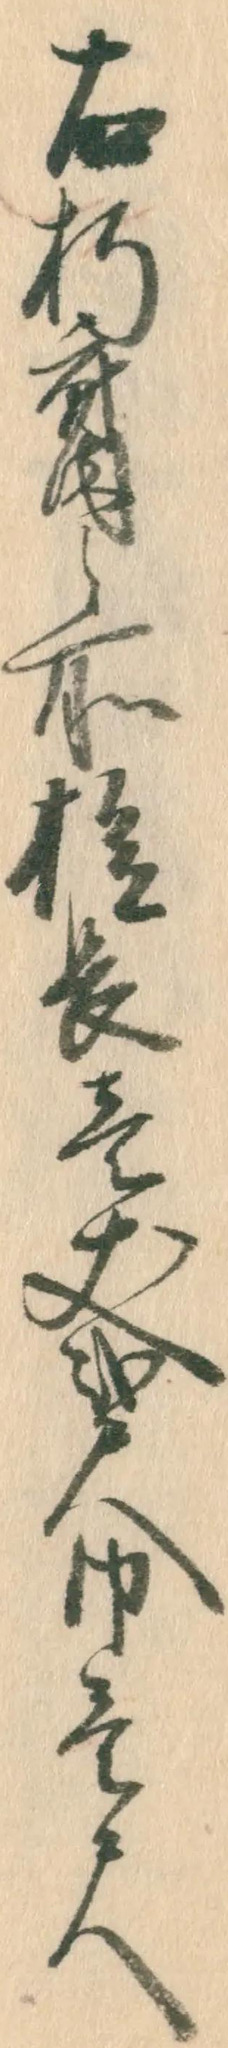右朽腐之所桧長壱丈弐尺巾壱尺
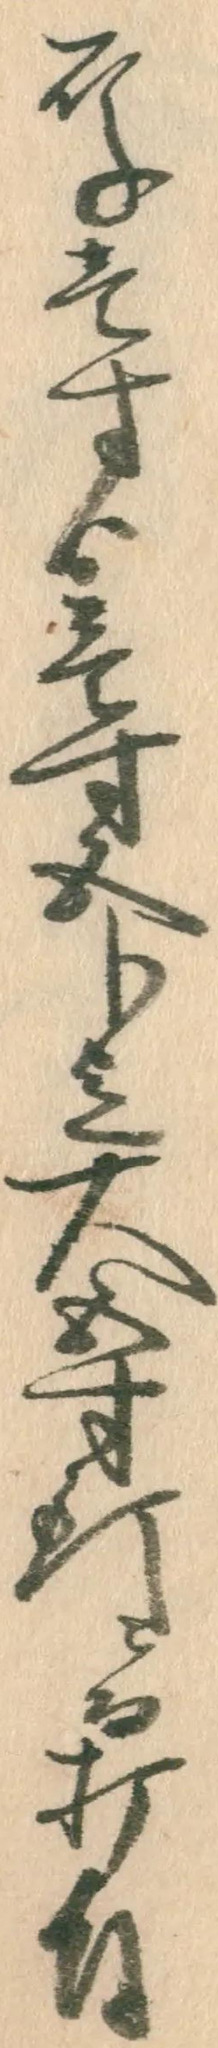厚壱寸ゟ壱寸五分迄大五寸釘ニ而打付

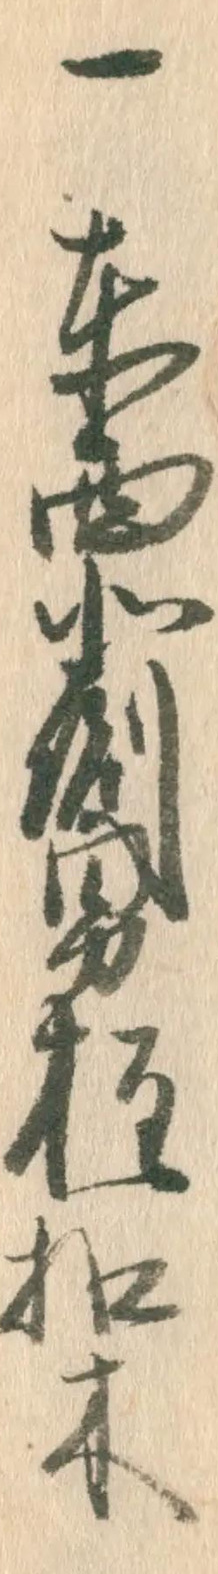一東西北側男柱扣木
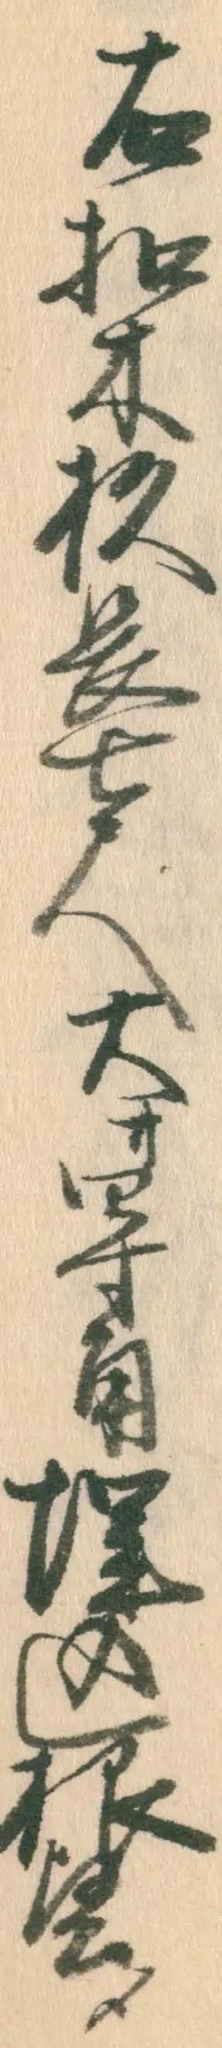右扣木杉長七尺大サ四寸角埋込根堅メ
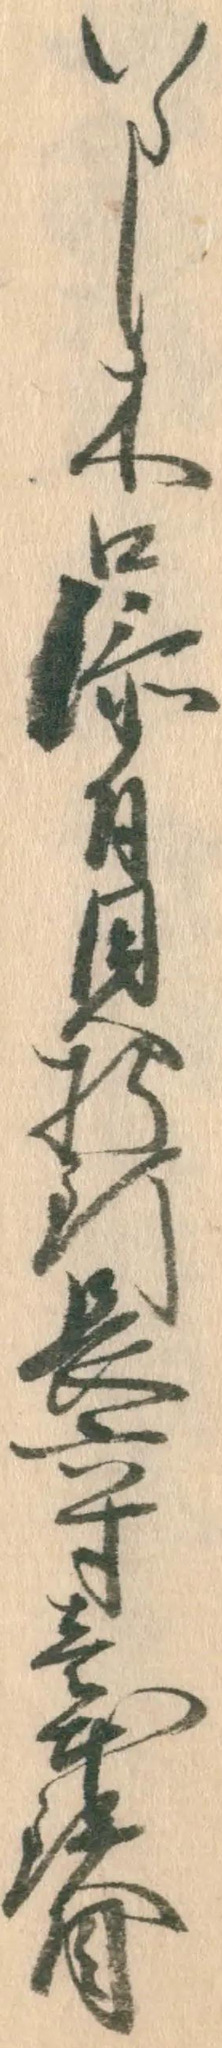いたし小口添付貝折釘長六寸壱本鉄目
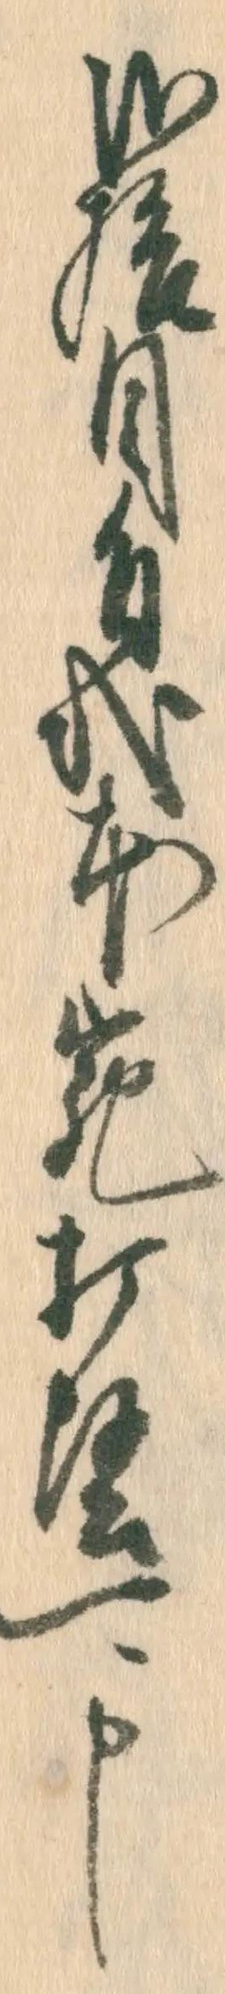弐拾目付弐本宛打堅可申
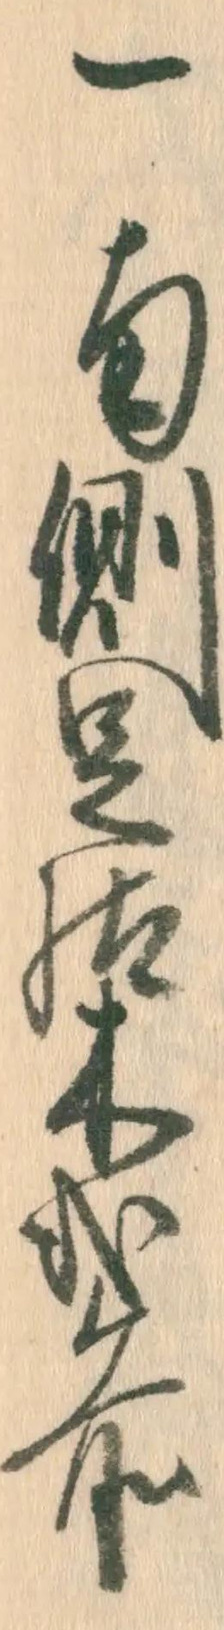一南側足駄木弐ケ所
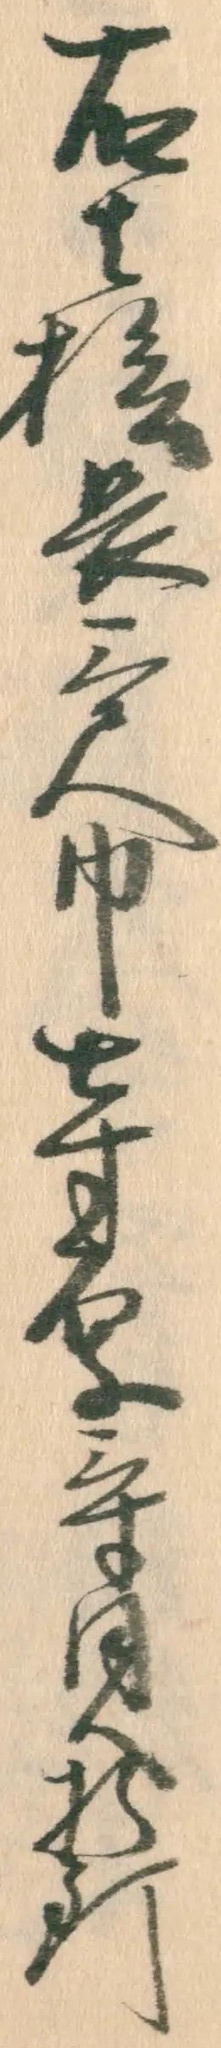右は桧長三尺巾七寸厚三寸貝折釘
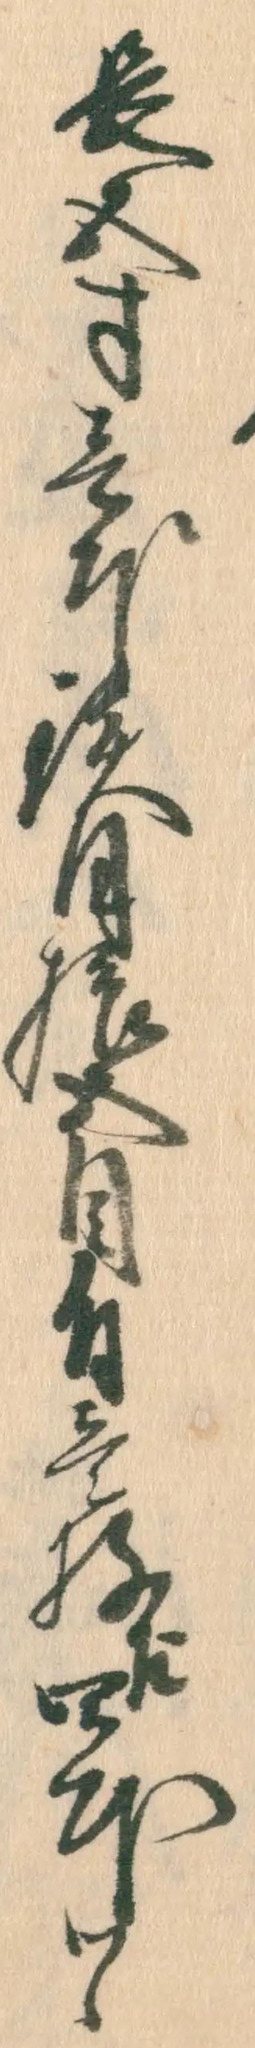長五寸壱本鉄目拾五目付壱枚え四本ツヽ
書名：三橋 17巻. [8] 三橋小破御修復書留　但御奉行御掛リ替地震潰橋番屋　嘉永四亥年より安政二卯年迄　下
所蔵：国立国会図書館 National Diet Library, JAPAN
